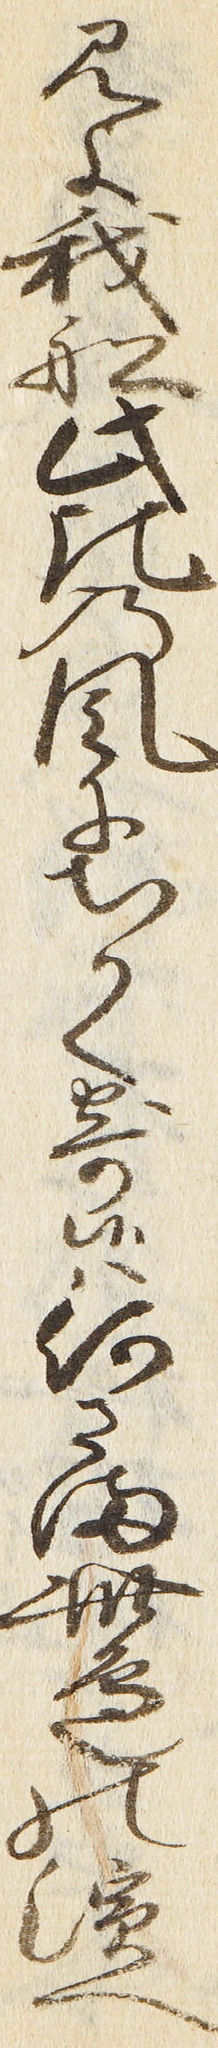見よ我船比の風にちかく寄候は何さま此辺の浜へ
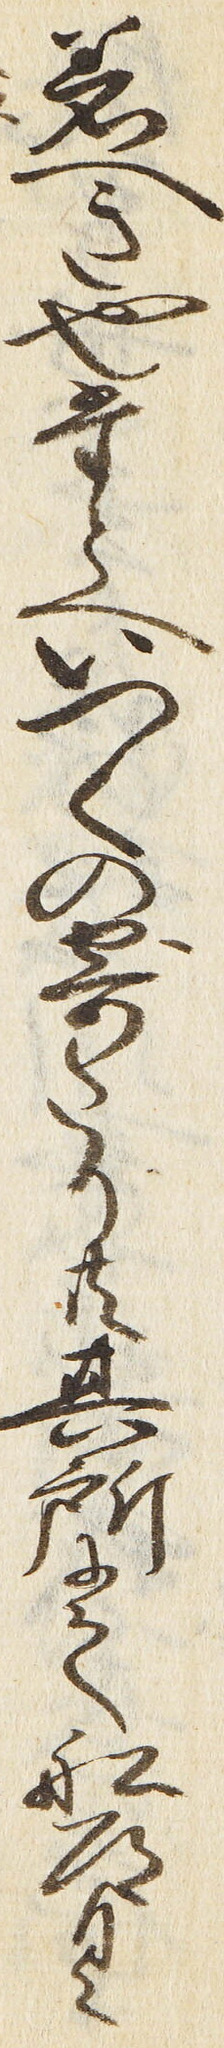着へき也たとへいつくの寄たり共其所にて船道具
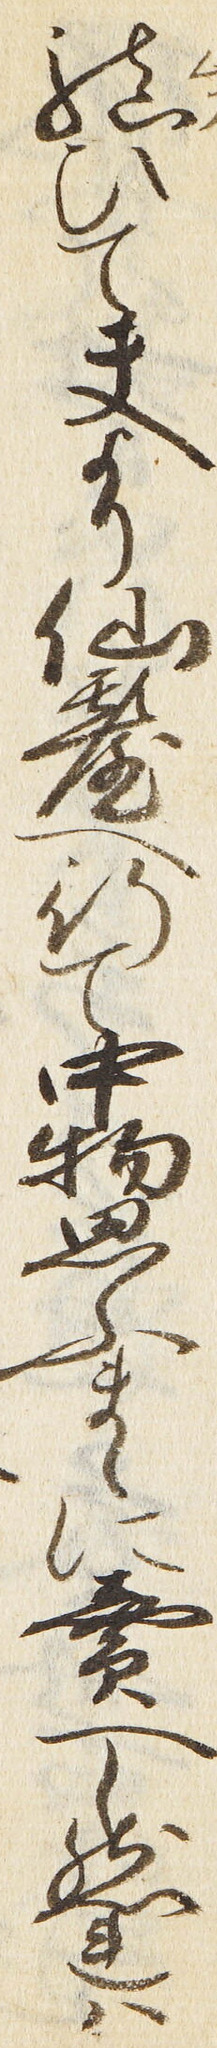結ひて夫より仙台へ行て中物思ふまゝに売へし然れは
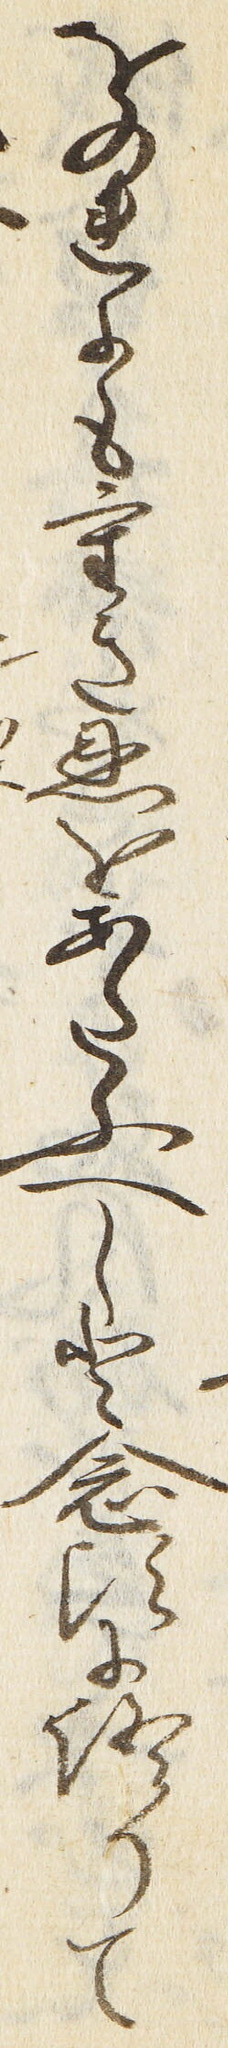をのれににも重き恩をあたふへしと念頃に語りて
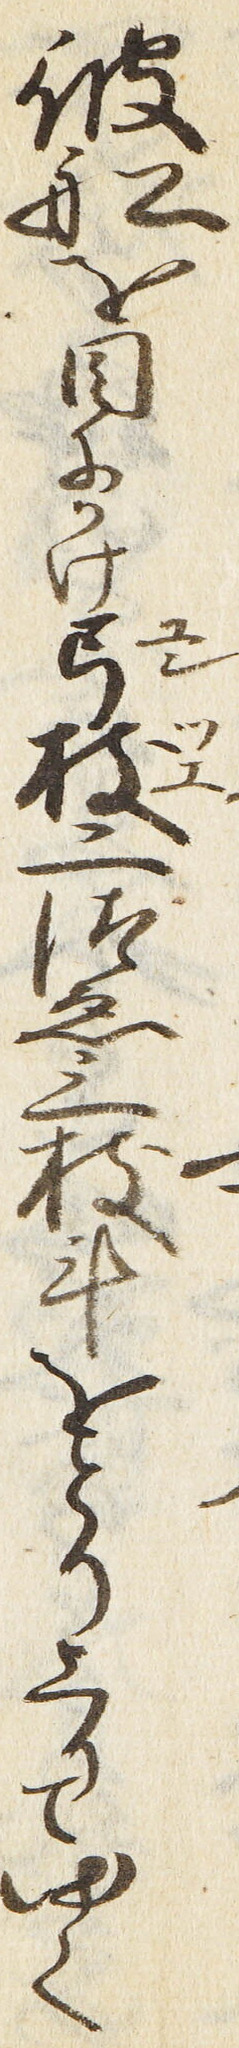彼船を目にかけ弓杖二つゑ三枝計をとり上りてゆく
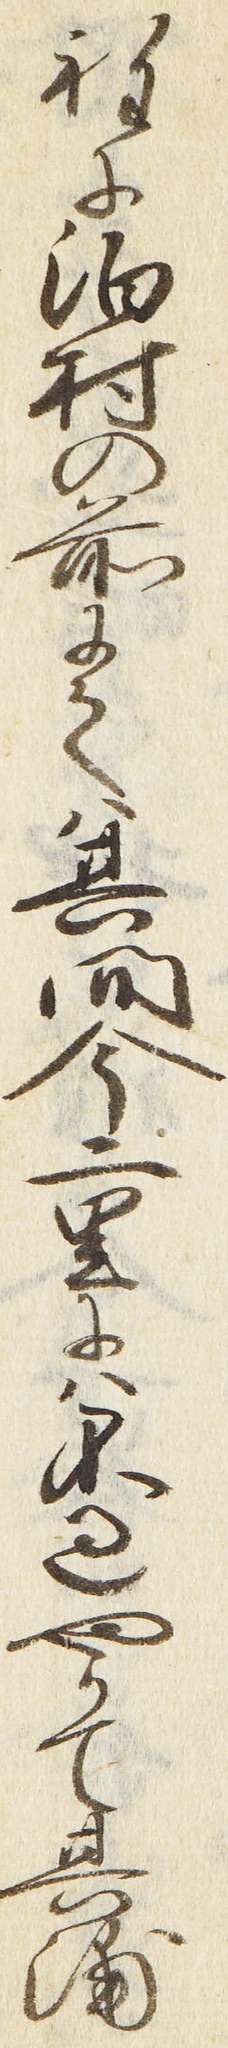程に泊村の前にては其間今二里には不過やかて其浦
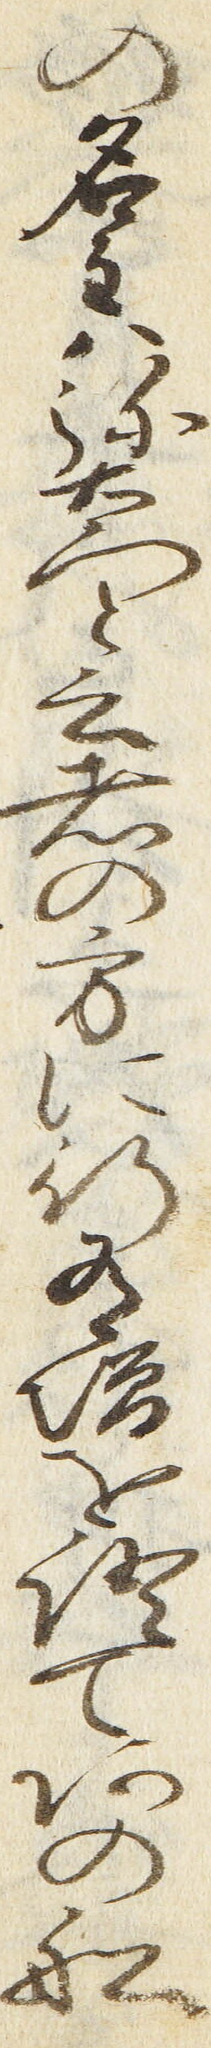の名主は弥右衛門と云者の方に行有増を語てあの船
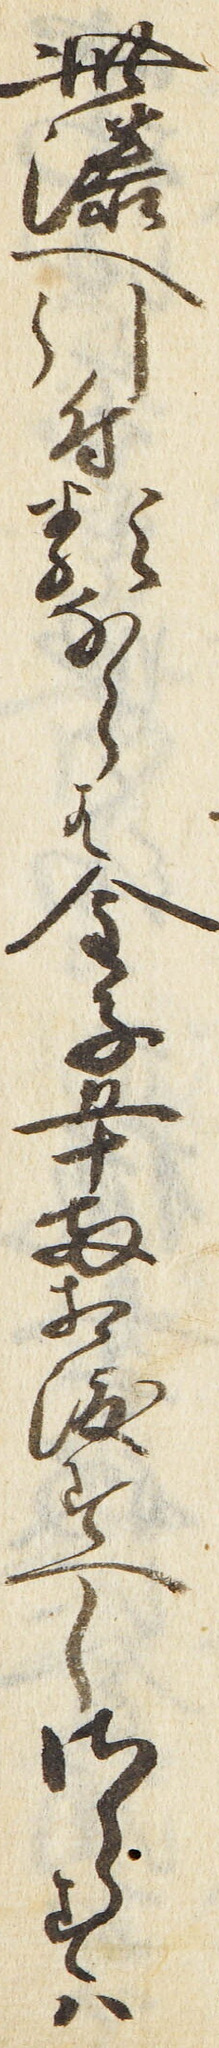此湊へ引付るならは金子五十両相渡すへしさらすは

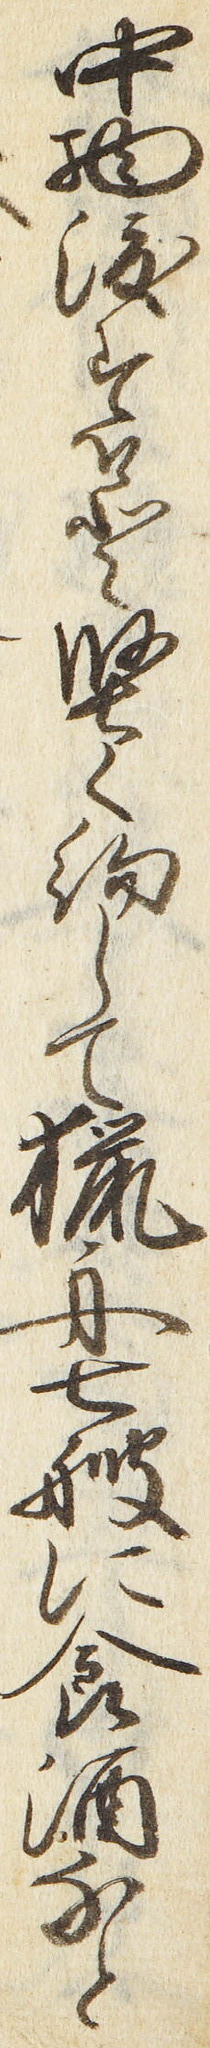中物渡すそと堅く約して猟舟七艘に食酒なと
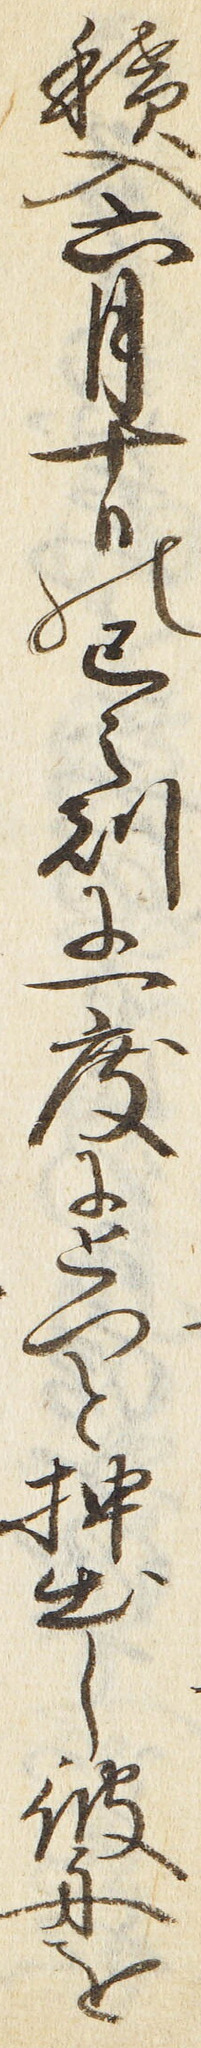積入六月十日の巳之刻に一度にとつと押出し彼舟を
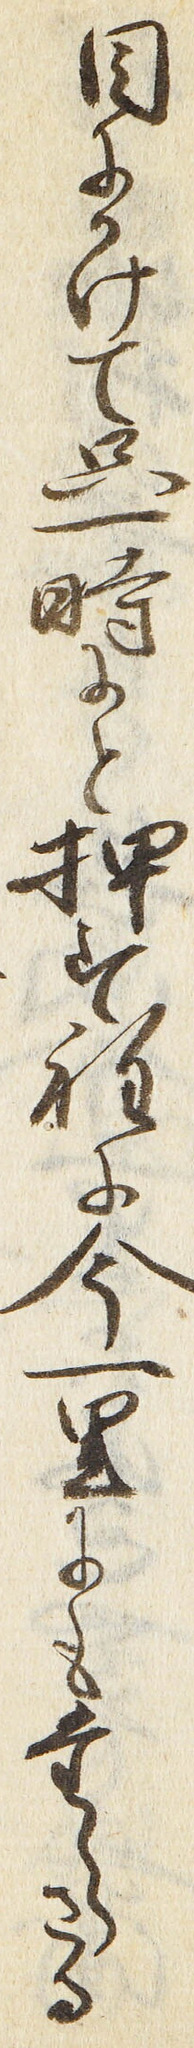目にかけて只一時にと押す程に今一里にもたらさる
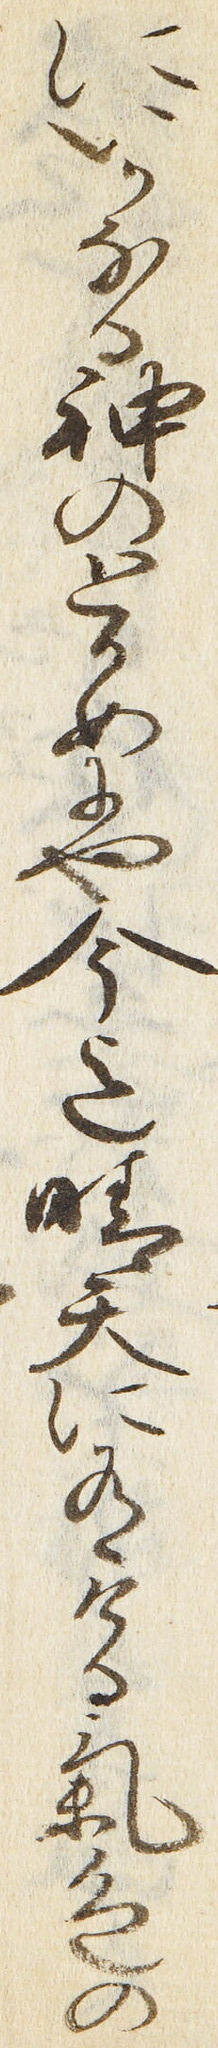にいかなる神のとかめにや今迄晴天に有ける気色の
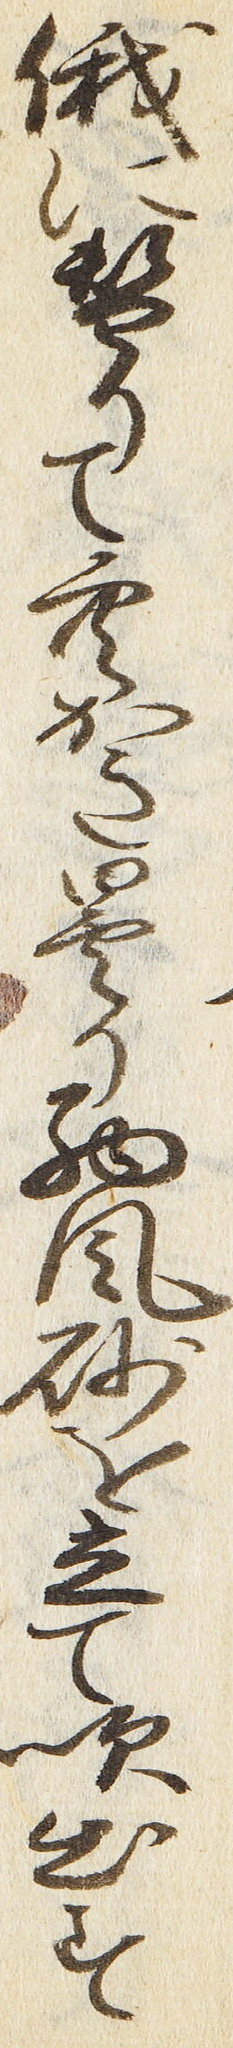俄に替りて空かき曇り西風砂を立て吹出す
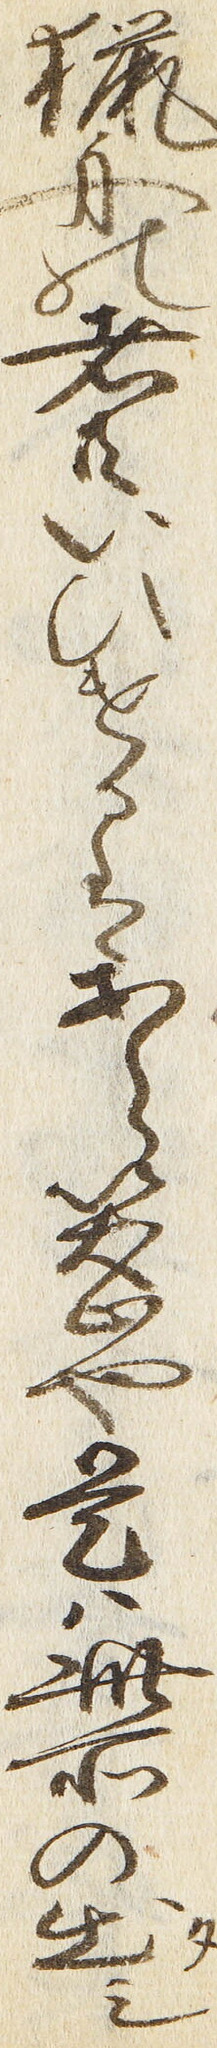猟舟の者共いひけるはあら笑止や是は此所の出し
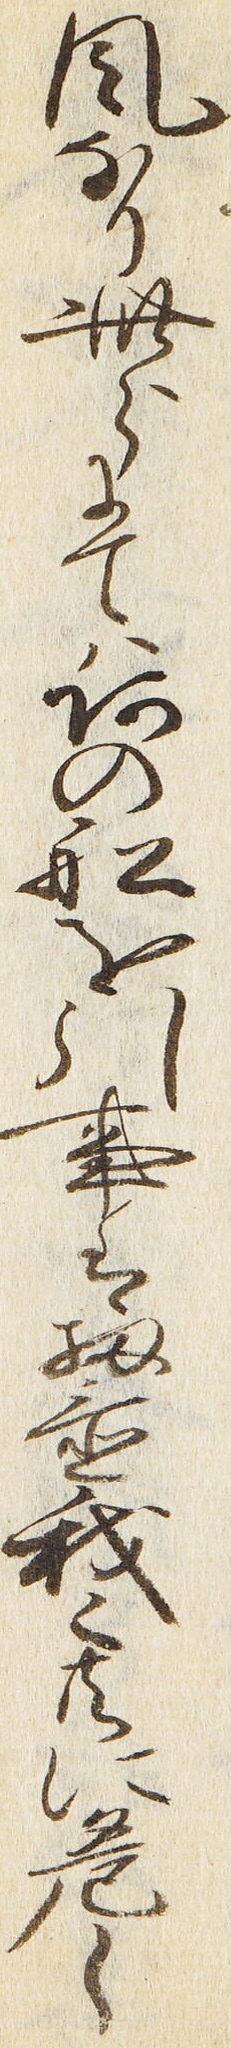風なり此らにてはあの船を引事は扨置我々共に危し
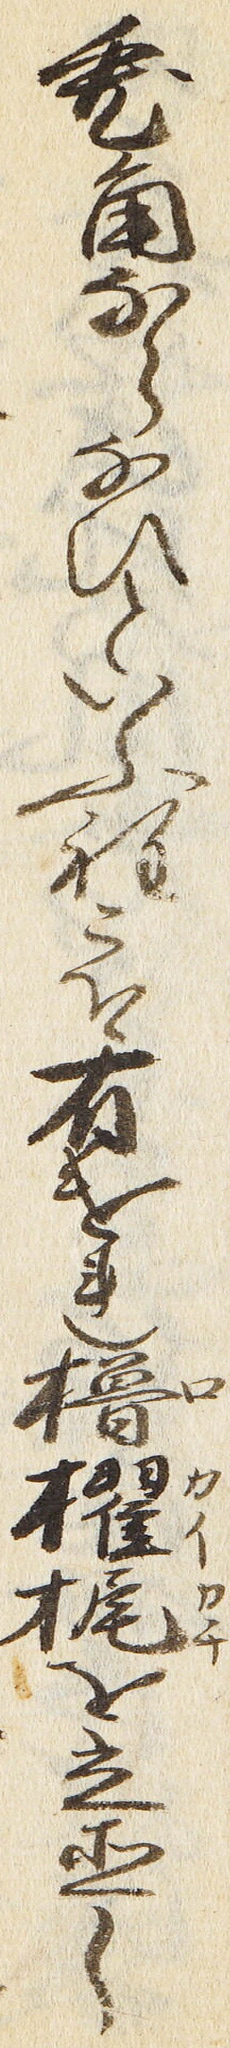兎角ならなひといふ程こそ有けれ櫓櫂梶を立直し
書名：海陸世話日記
